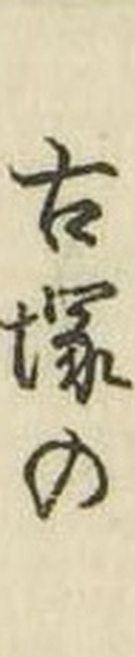古塚の
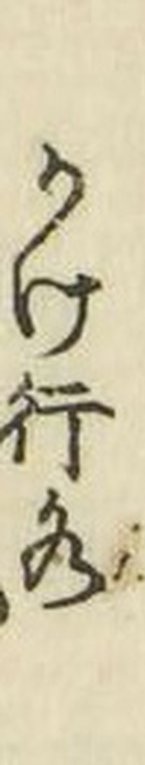かけ行水
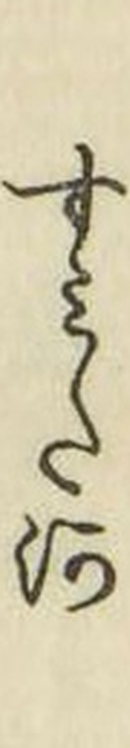すみた河
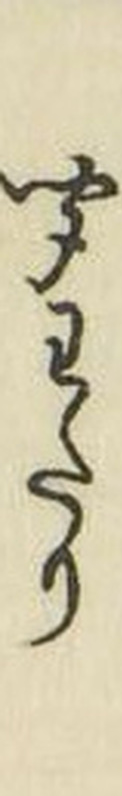聞わたり
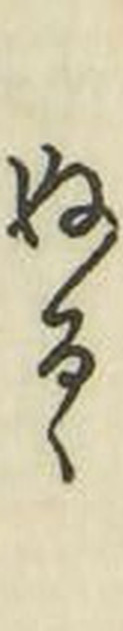ぬるゝ
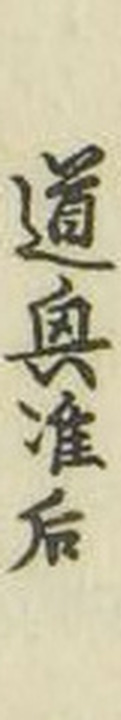道興准后

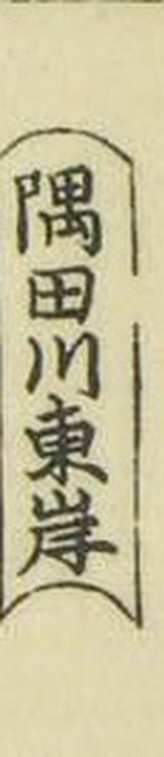隅田川東岸
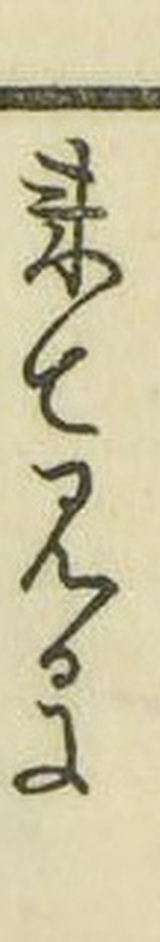来て見るに
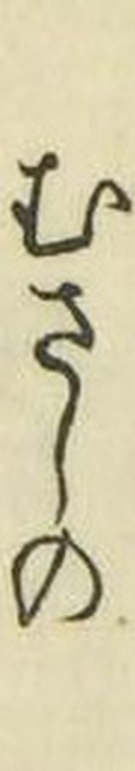むさしの
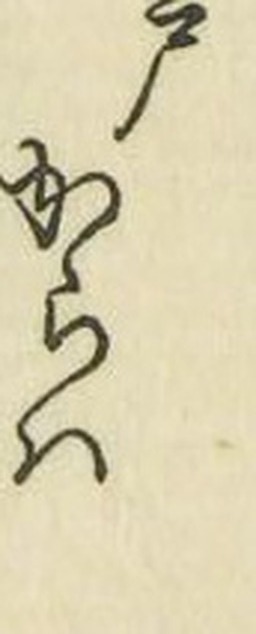からは
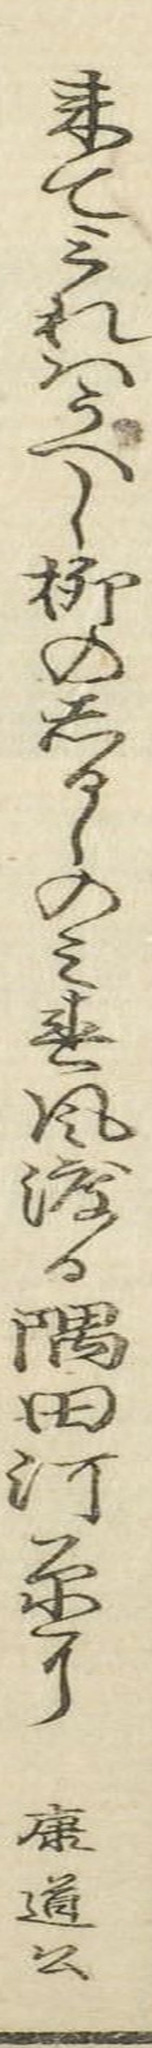来てみれはうへし柳のしるしのみ春風渡る隅田河原に康道公
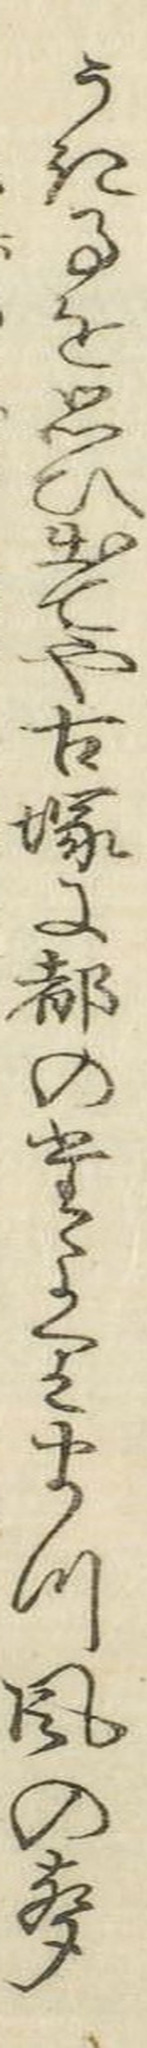うき事を思ひ出てや古塚に都のたよりまつ風の声近衛信尹公
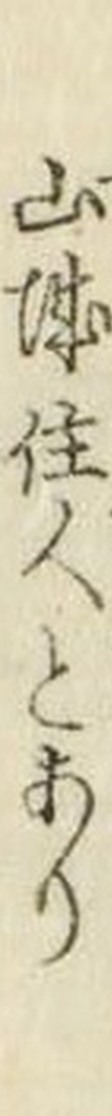山城住人とあり
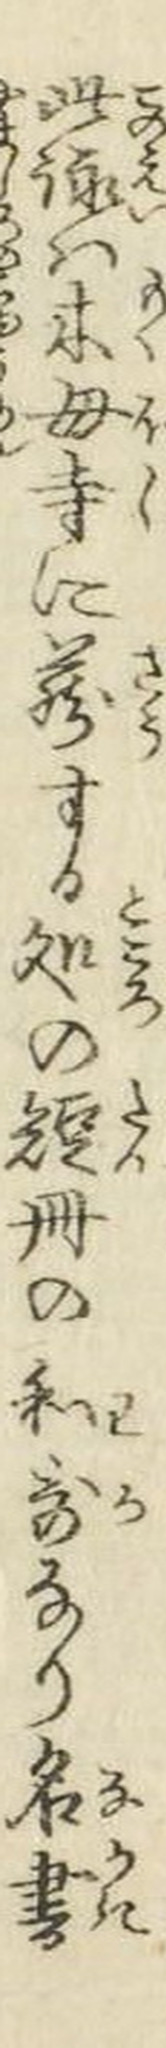此詠は木母寺に蔵する処の短冊の和歌なり名書
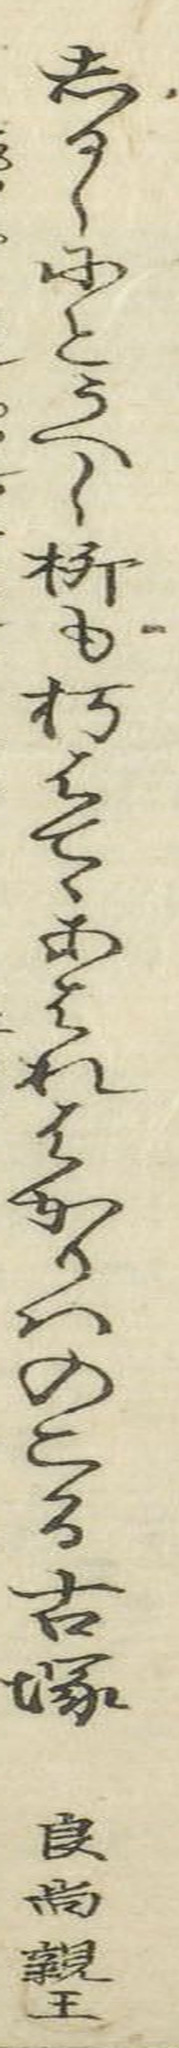しるしにとうへし柳も朽はてゝあはれはかりはのこる古塚良尚親王
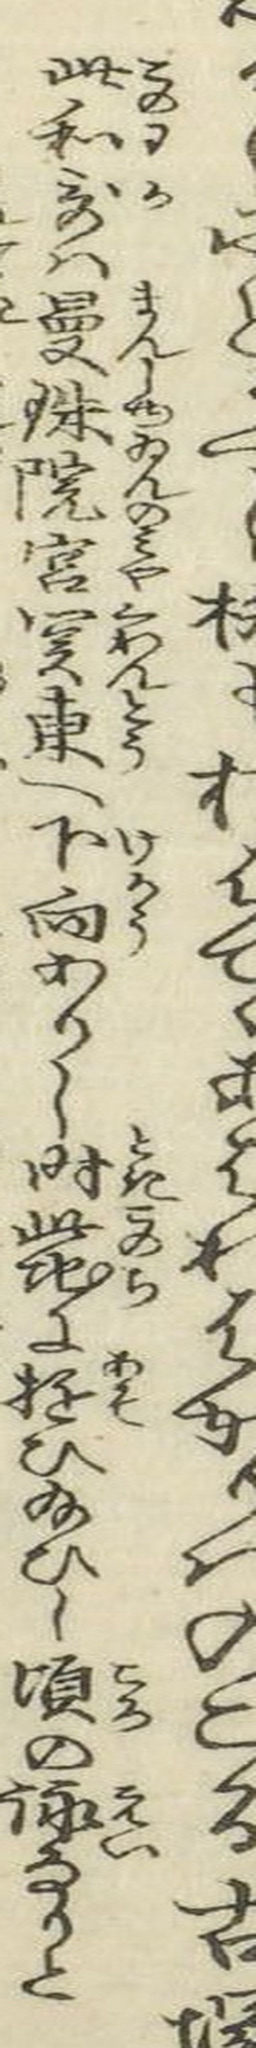此和歌は曼殊院宮関東へ下向ありし時此地に遊ひ給ひし頃の詠なりと
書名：江戸名所図会 20巻 巻之19
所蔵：東京学芸大学教育コンテンツアーカイブ
